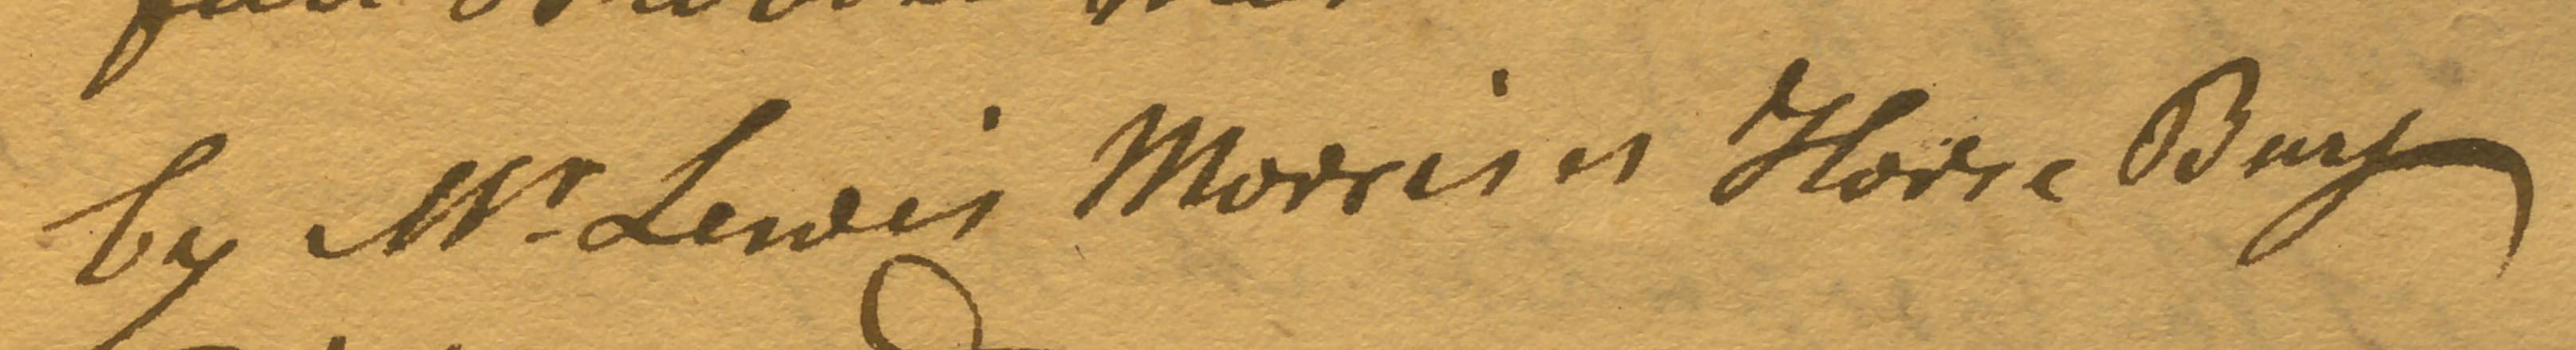by M^r. Lewes Morrises Horse Bay
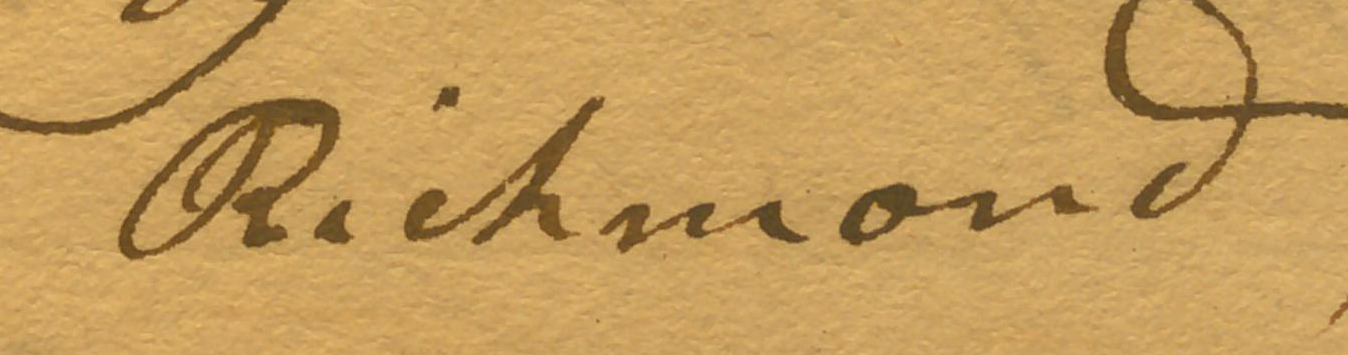Richmond
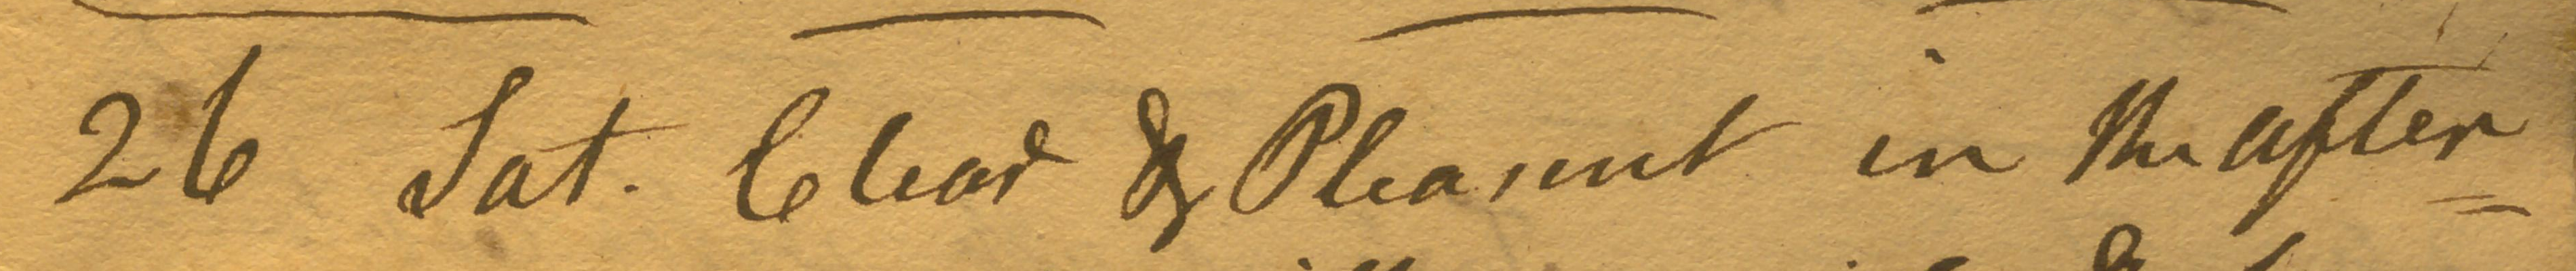26 Sat. Clear & Pleasent in the after
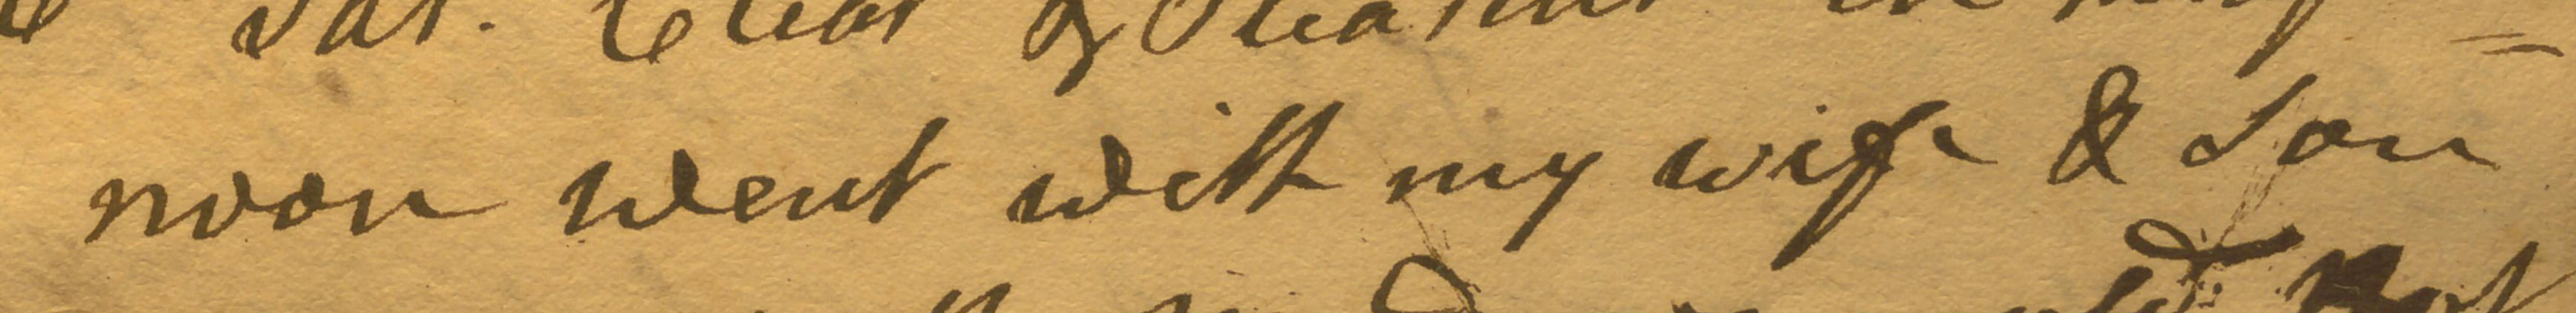noon went with my wife & son
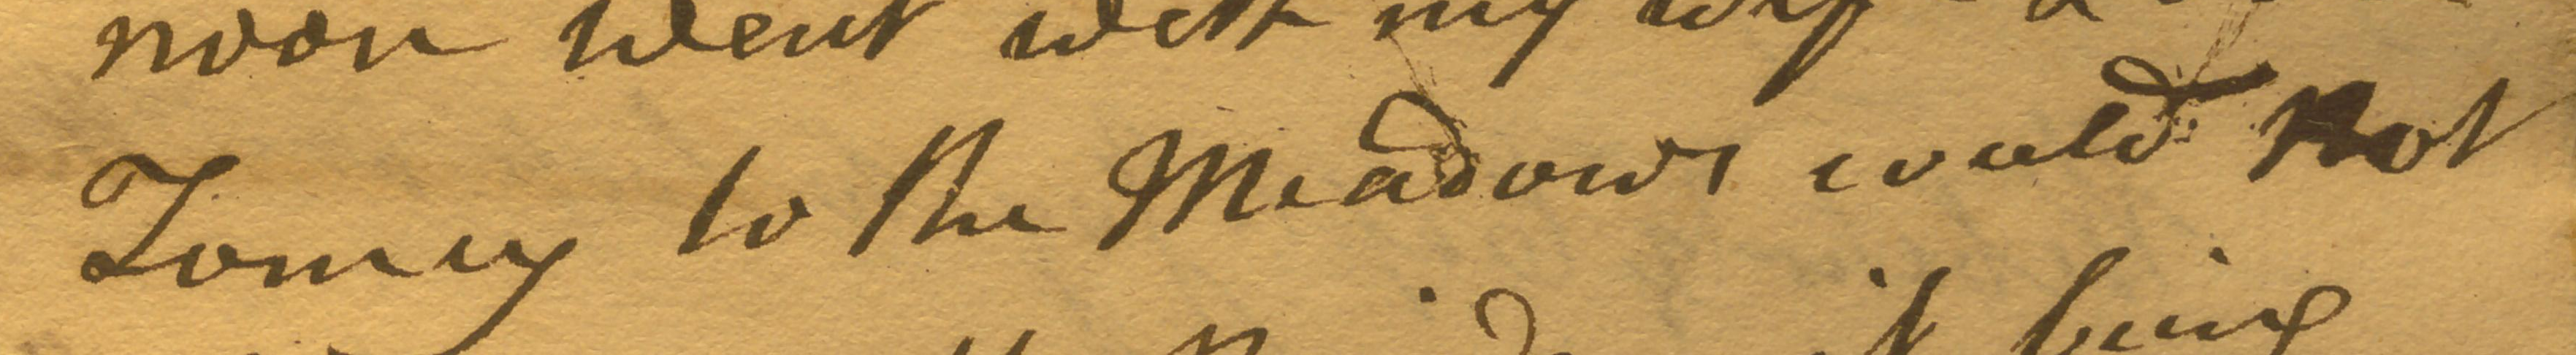Tomey to the Meadows could not
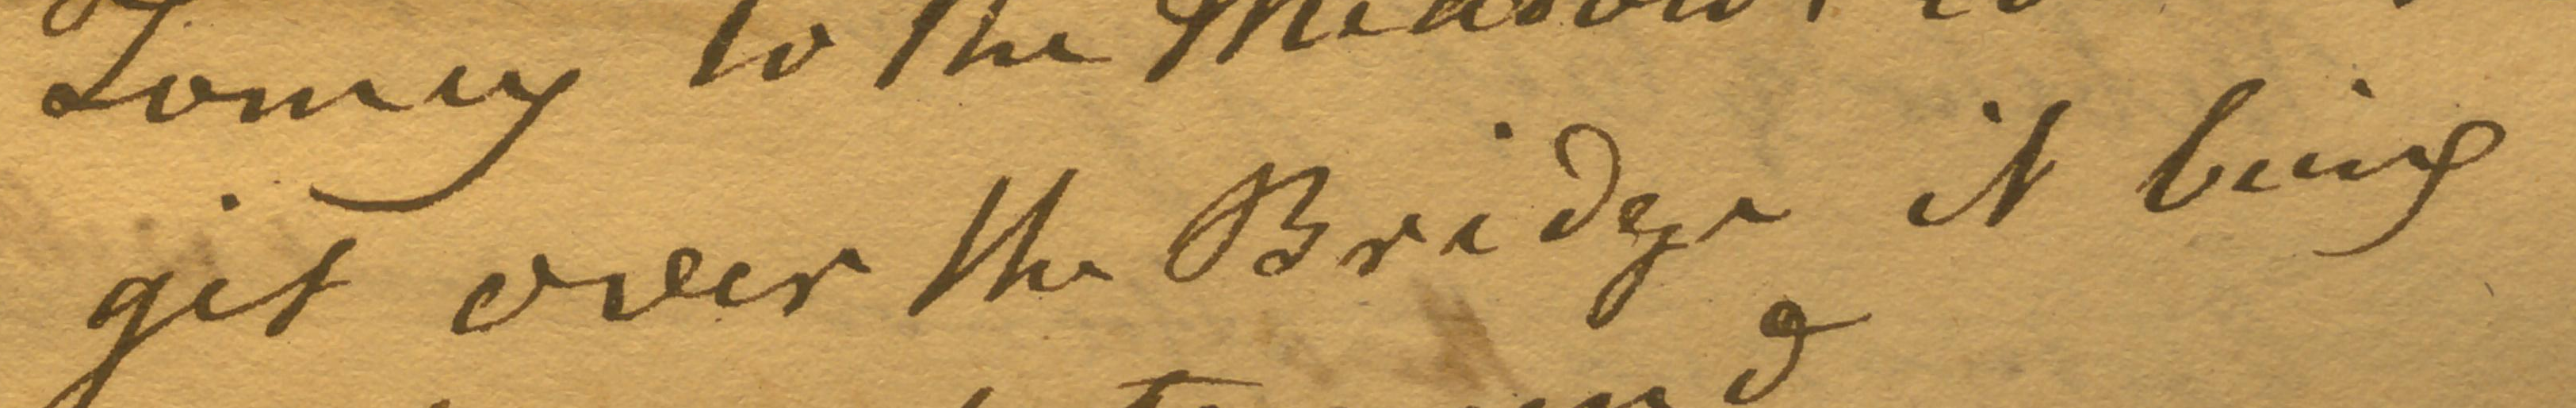git over the Bridge it being
